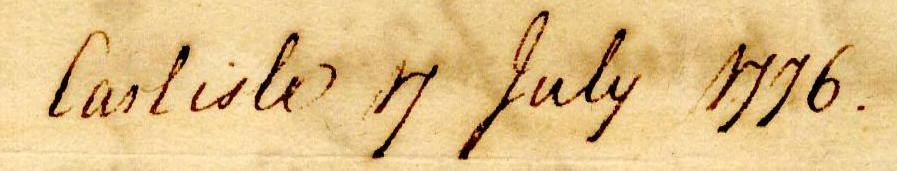Carlisle 17 July 1776.
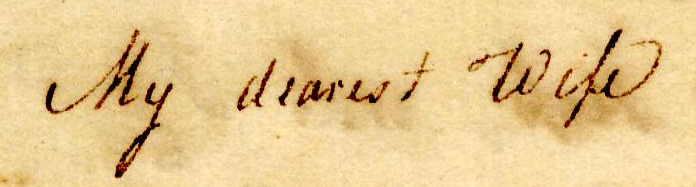My dearest Wife
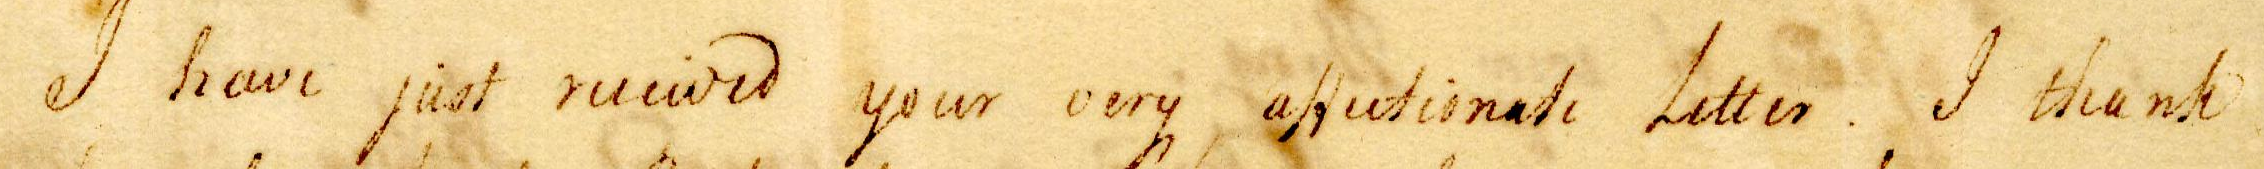I have just received your very affectionate Letter. I thank
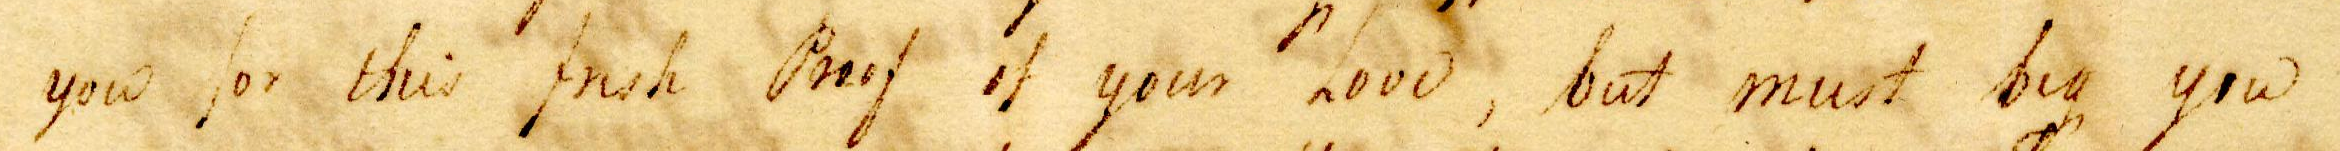you for this fresh Proof of your Love, but must beg you
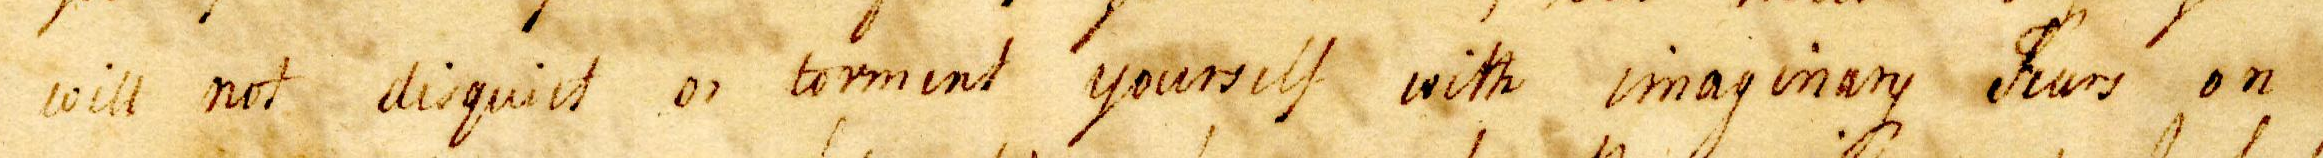will not disquiet or torment yourself with imaginary Fears on
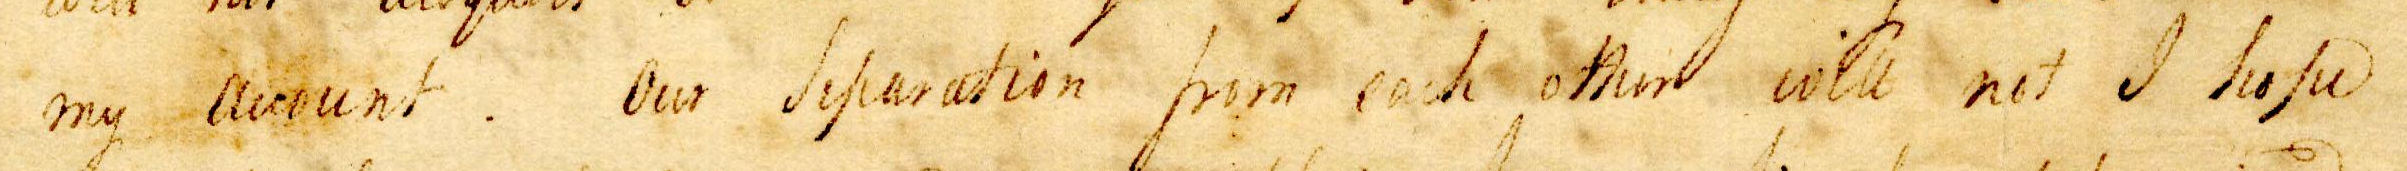my account. Our separation from each other will not I hope
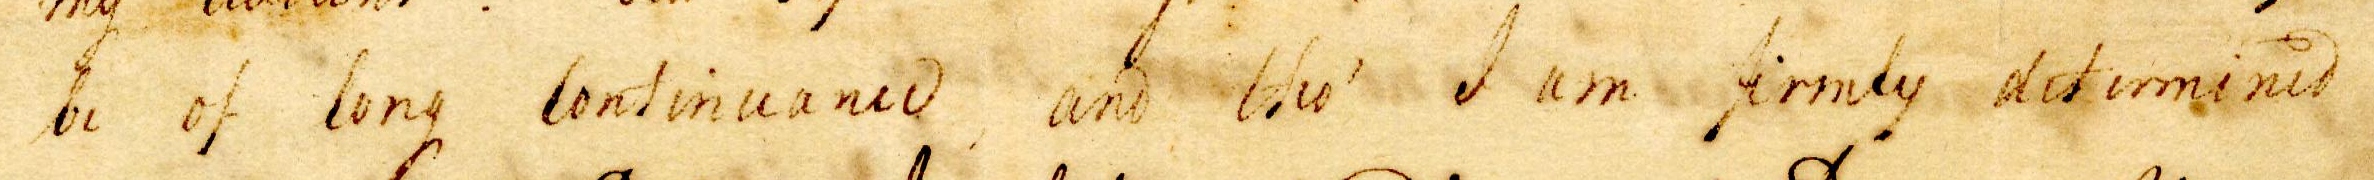be of long Continuance and tho' I am firmly determined
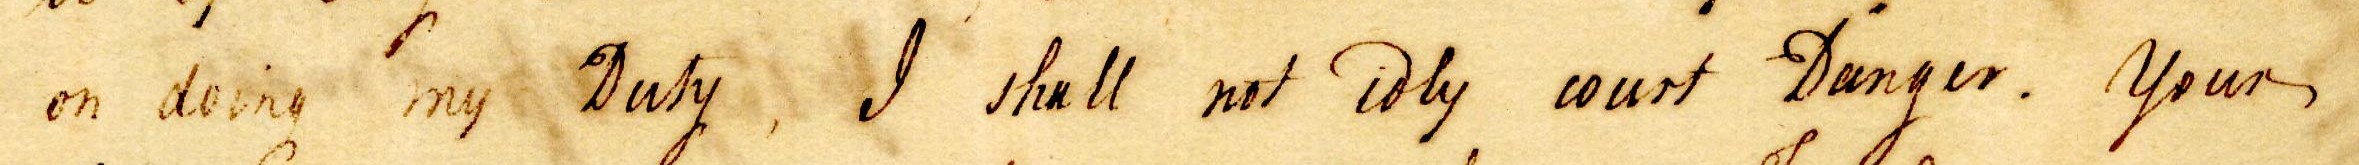on doing my Duty, I shall not idly court Danger. Your
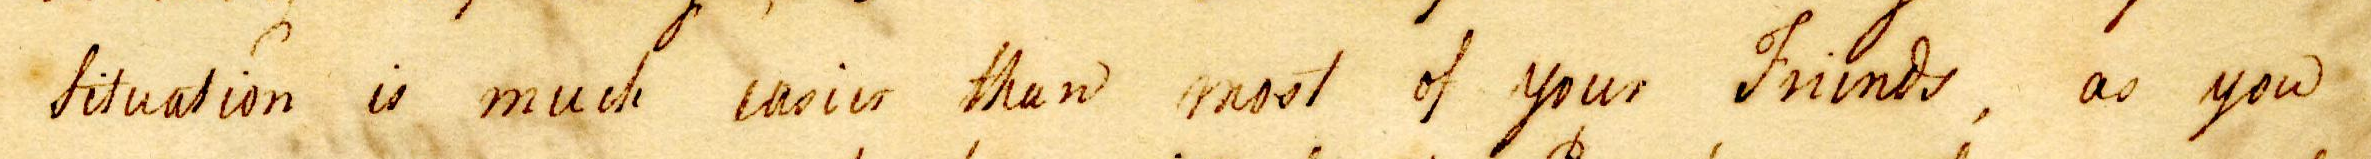Situation is much easier than most of your Friends, as you
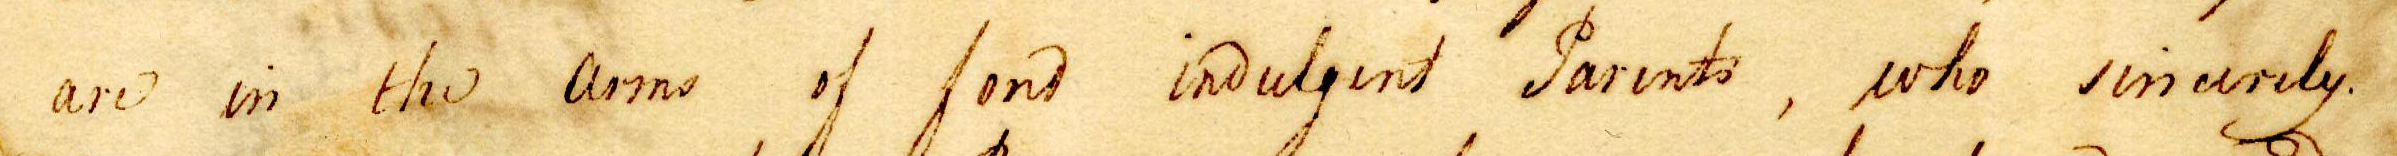are in the Arms of fond indulgent Parents, who sincerely
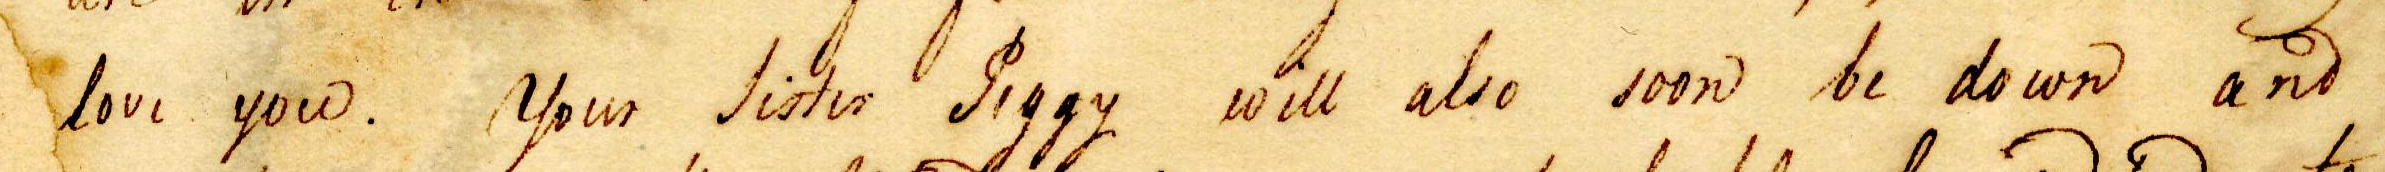love you. Your Sister Peggy will also soon be down and
